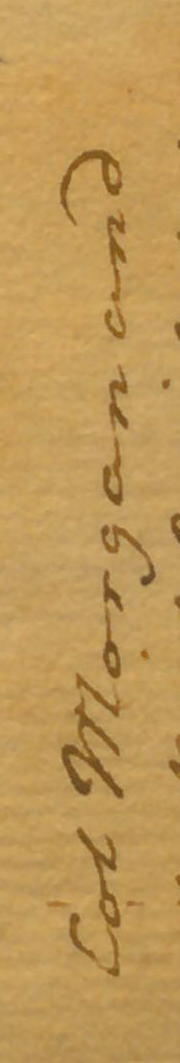Col Morgan and
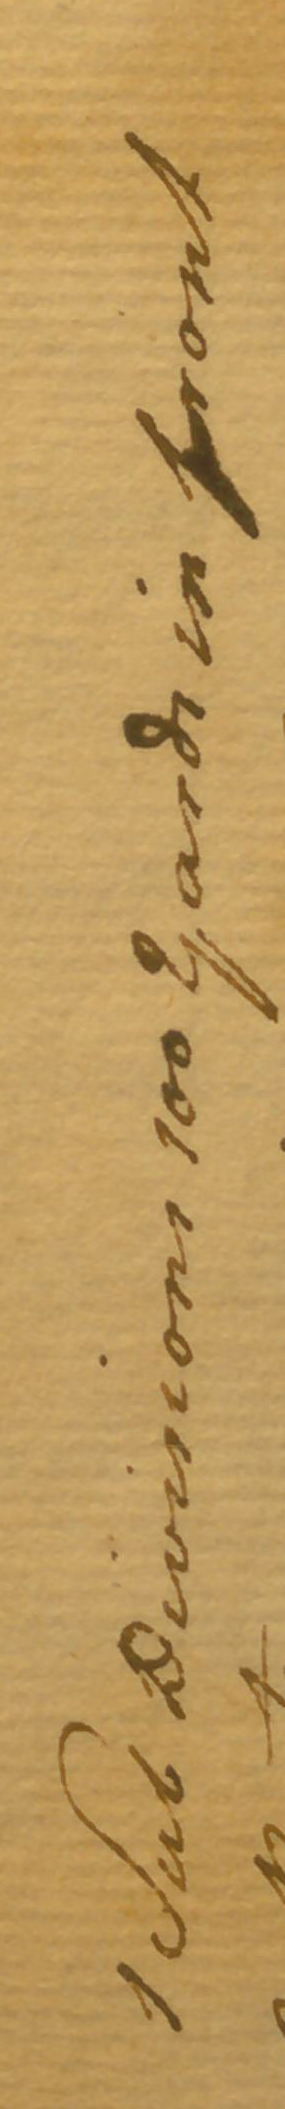1 Sub Divisions 100 Yards in front
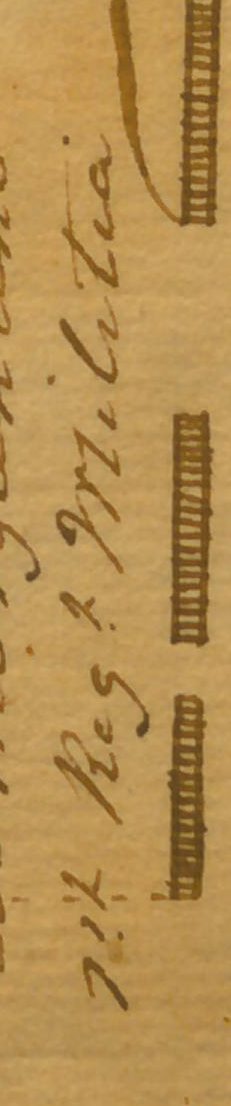1^st. Reg^t. Militia
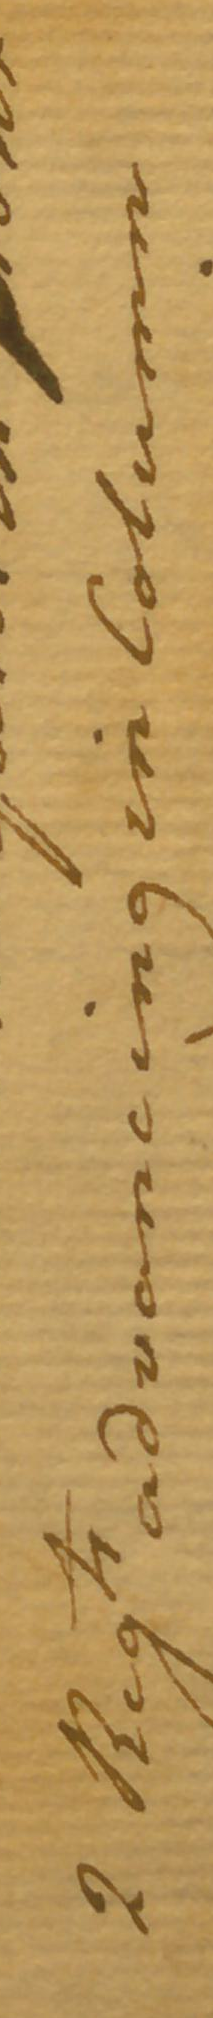2 Reg^ts advancing in Column
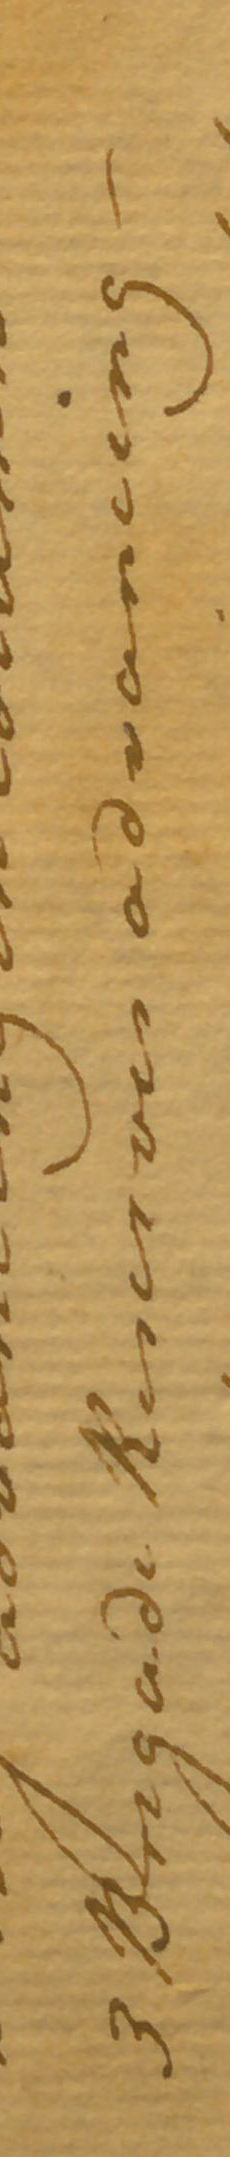3 Brigade Reserves advancing-
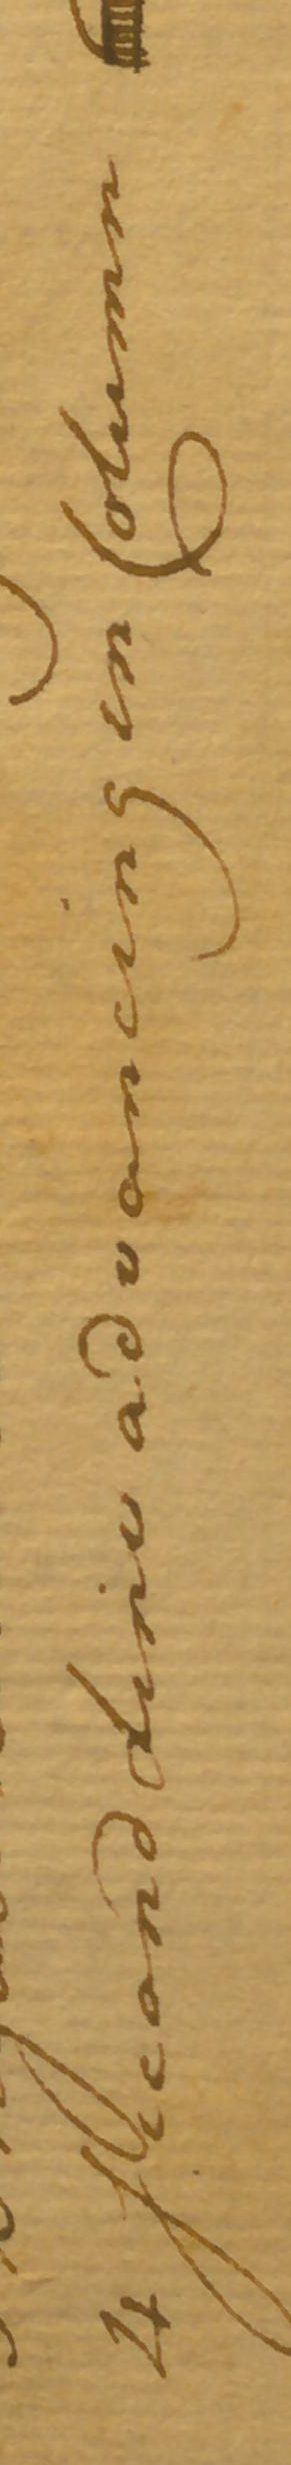4 second Line advancing in Columns
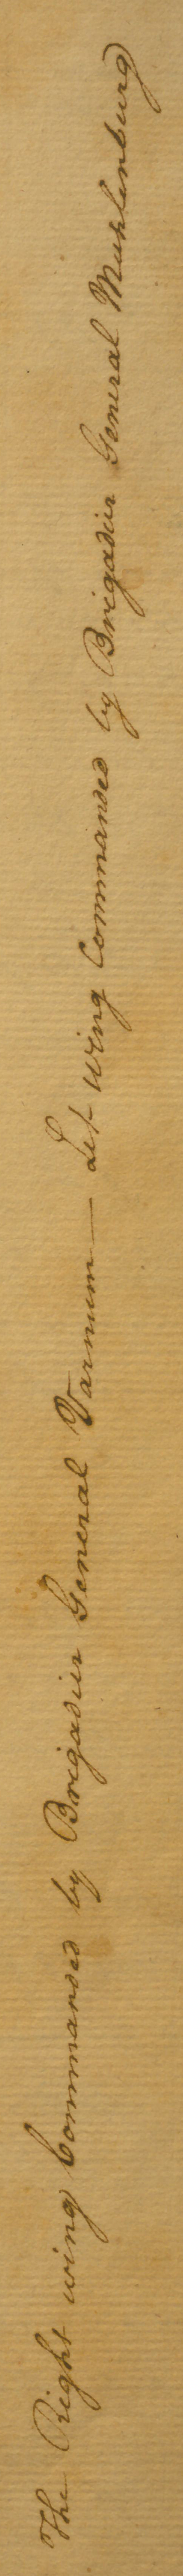The Right wing Commanded by Brigadier General Varnum- Let wing Commanded by Brigadier General Muhlenburg
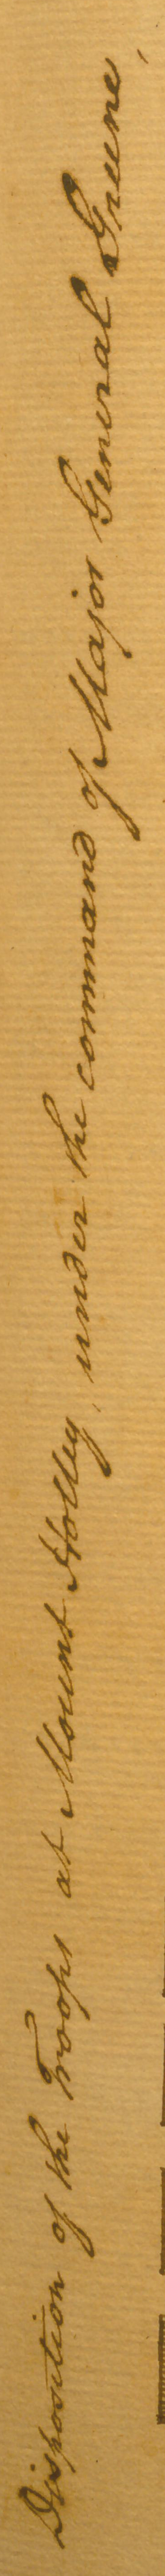Disposition of the Troops at Mount Holly under the command of Major General Greene
